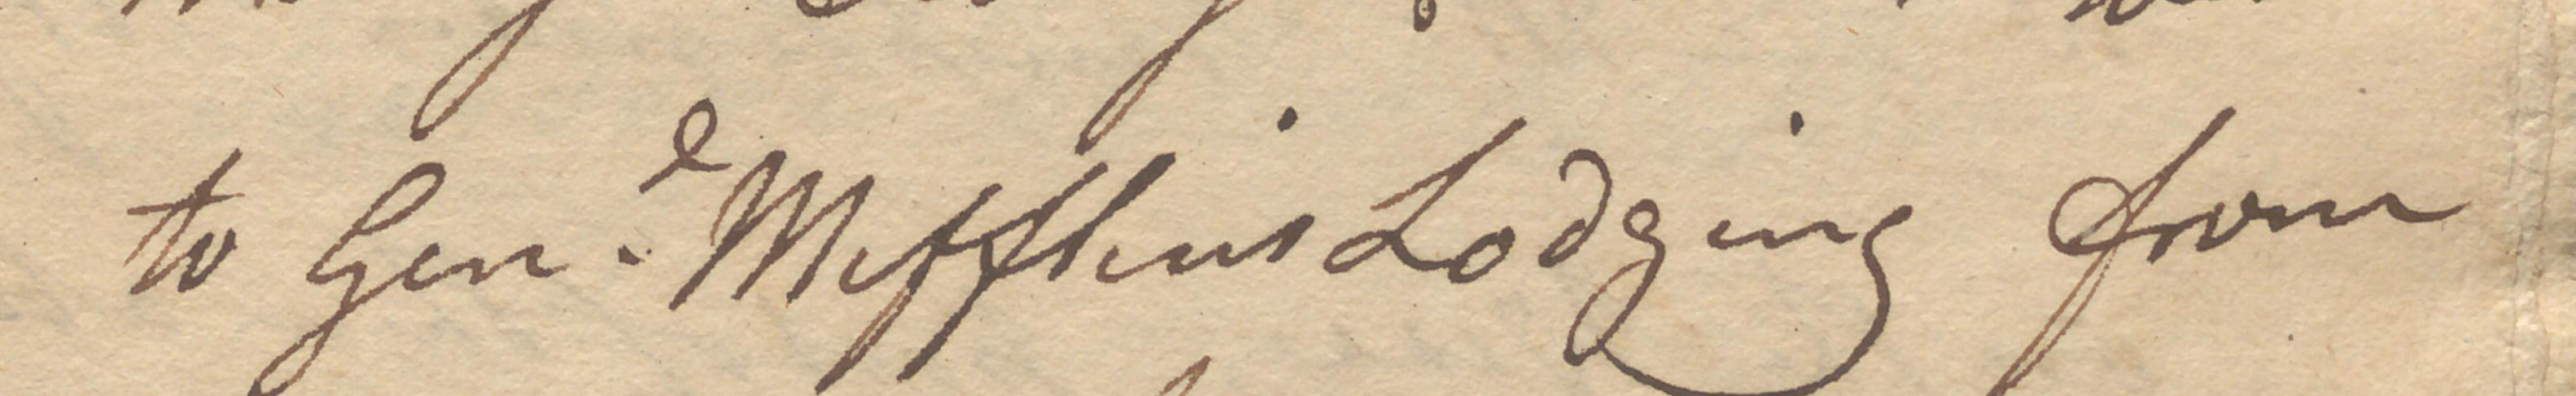to Gen^l. Mifflins Lodging from
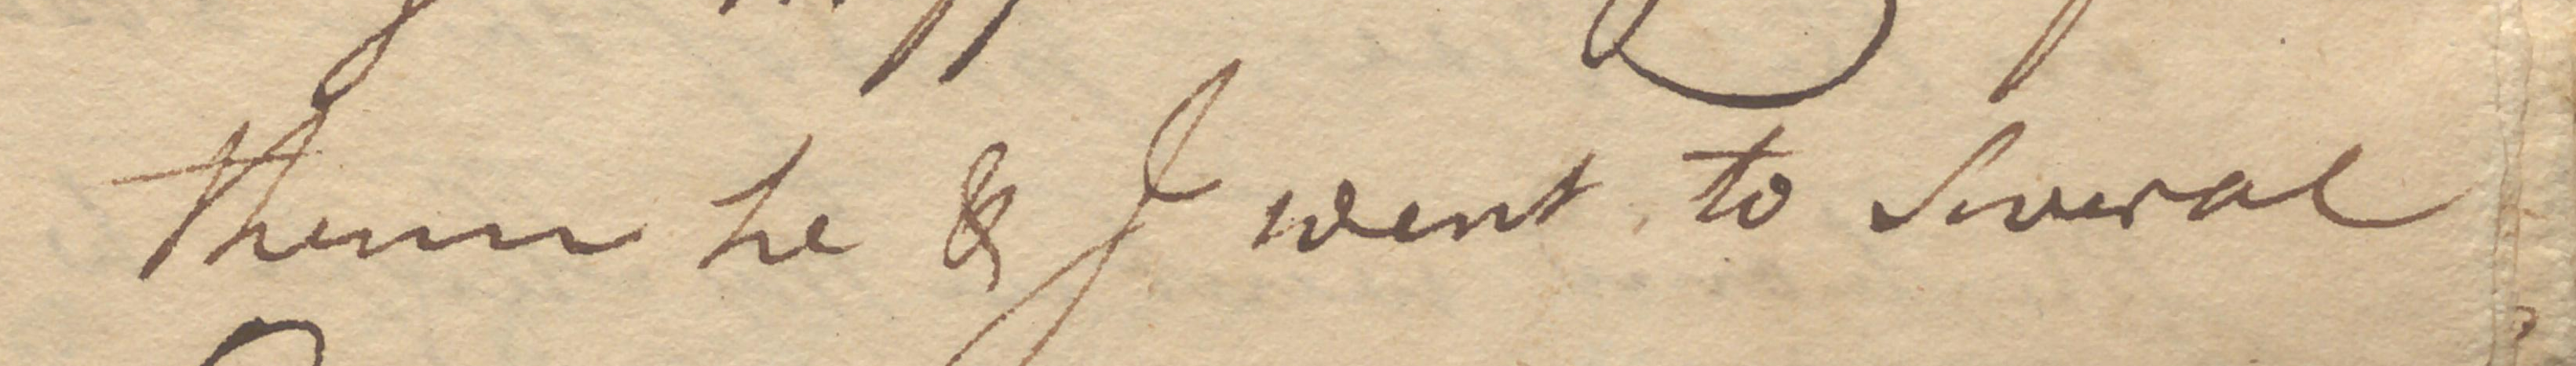thenec he & I went to several
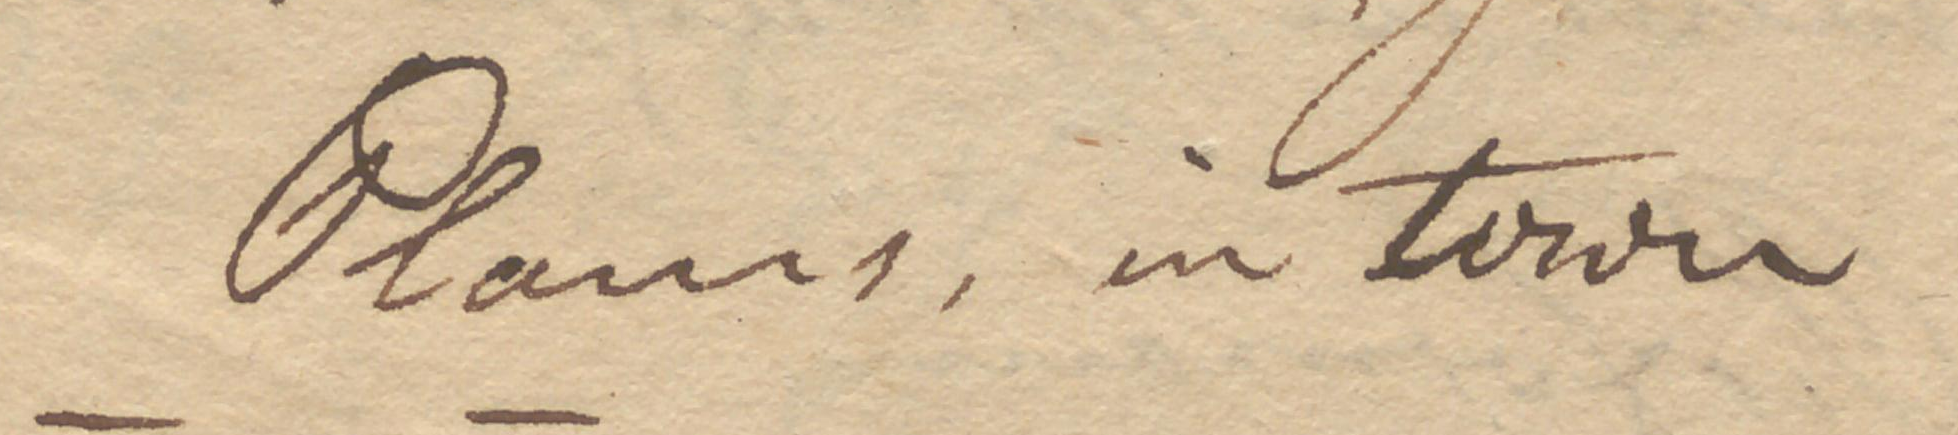Plans in town
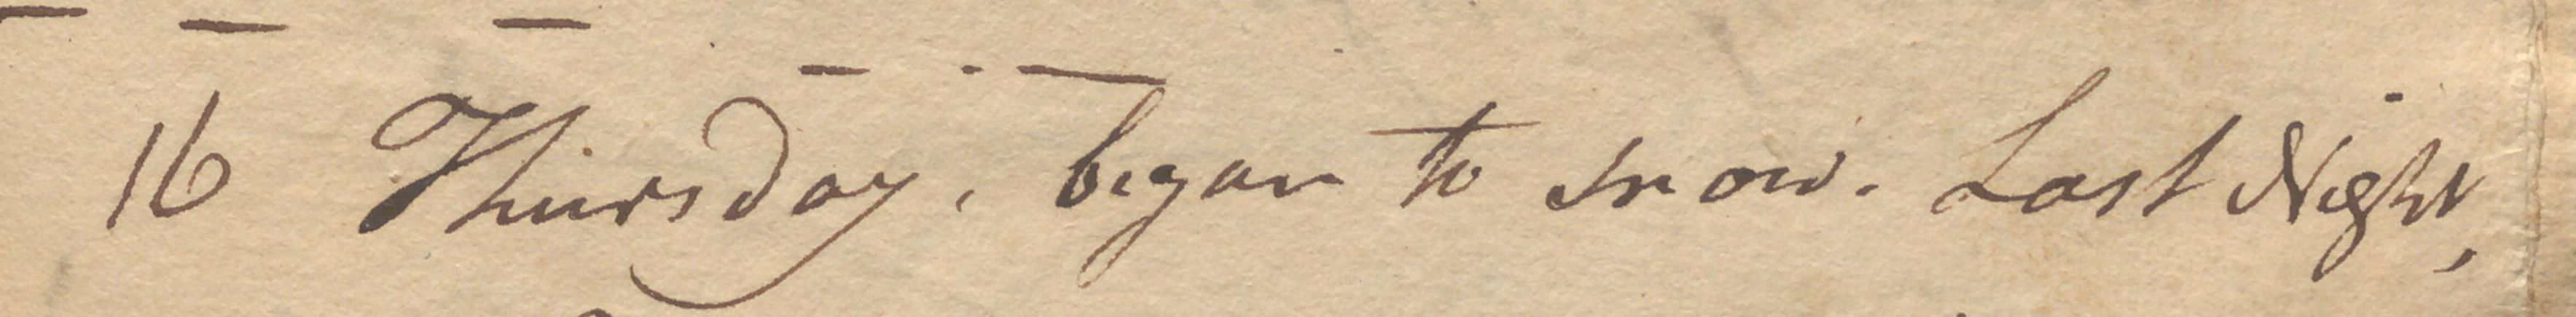16 Thursday. began to snow. Last Night
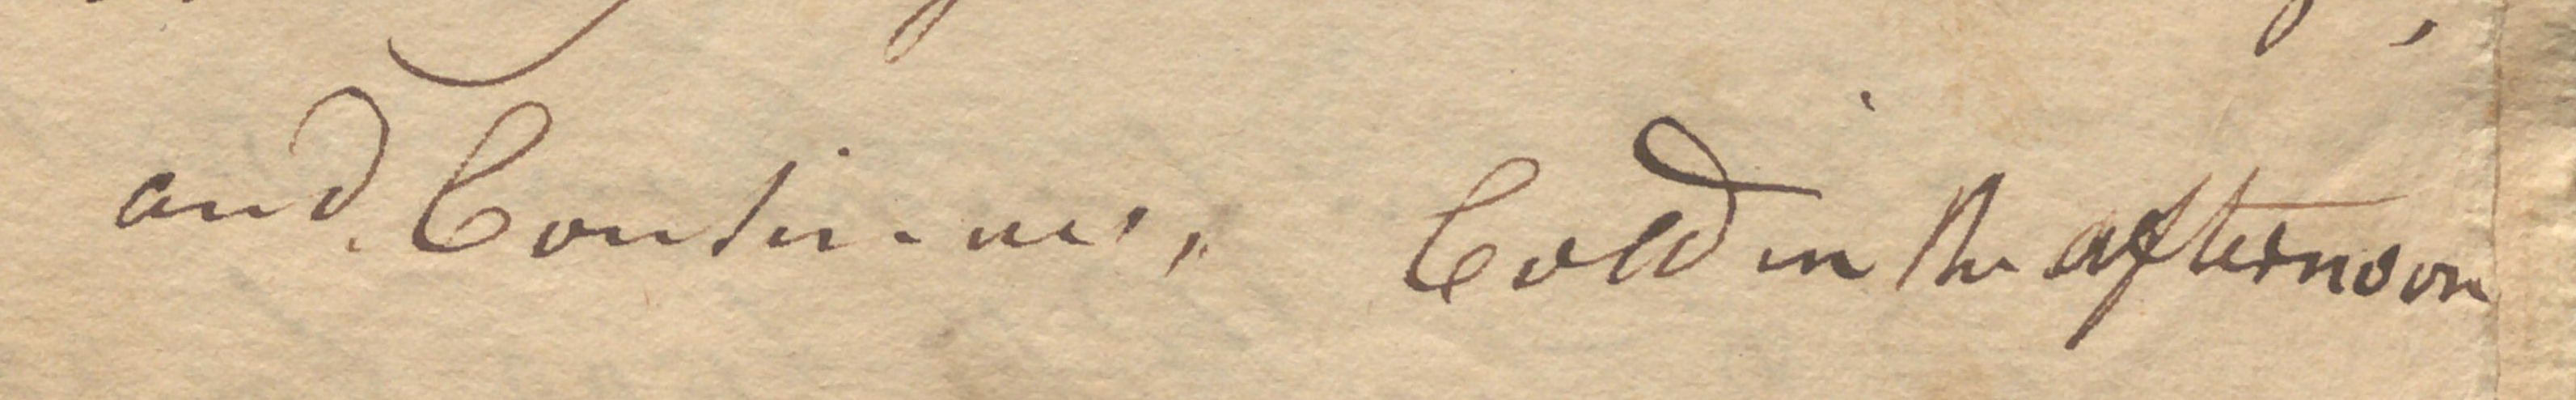and Contineues, Cold in the afternoon
